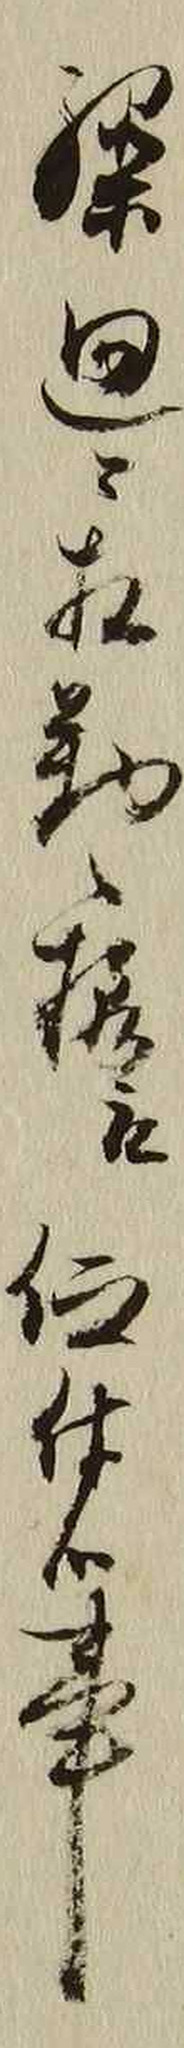繰廻ニ相勤候様被仰付候事
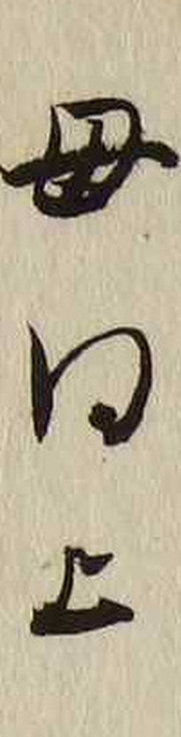母同上
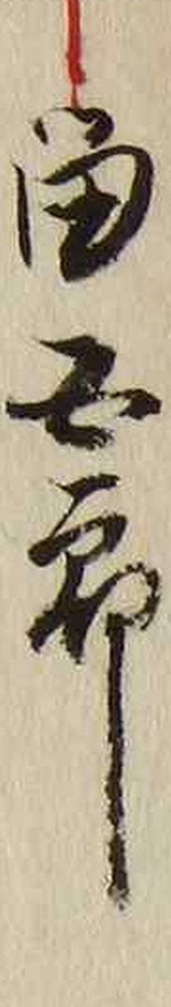留五郎
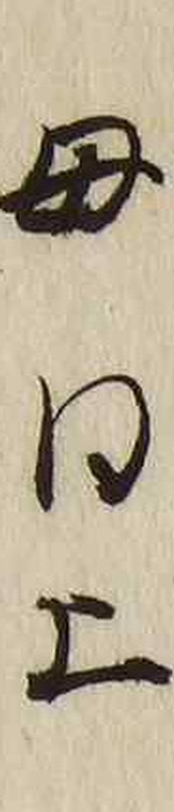母同上

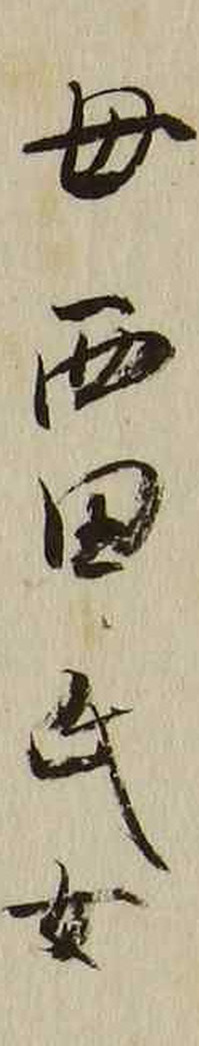母西田氏女
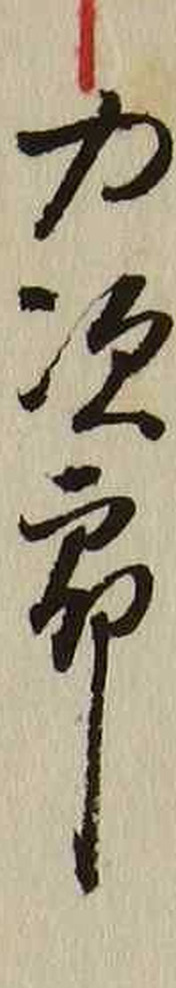力次郎
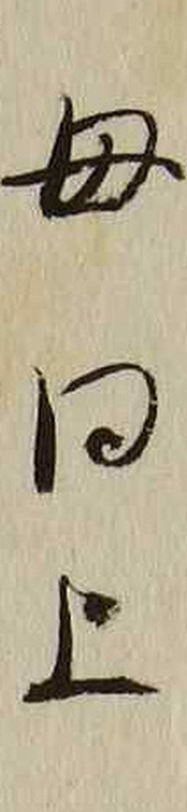母同上
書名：諸士系譜　巻之349　も之部5
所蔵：会津若松市立会津図書館
